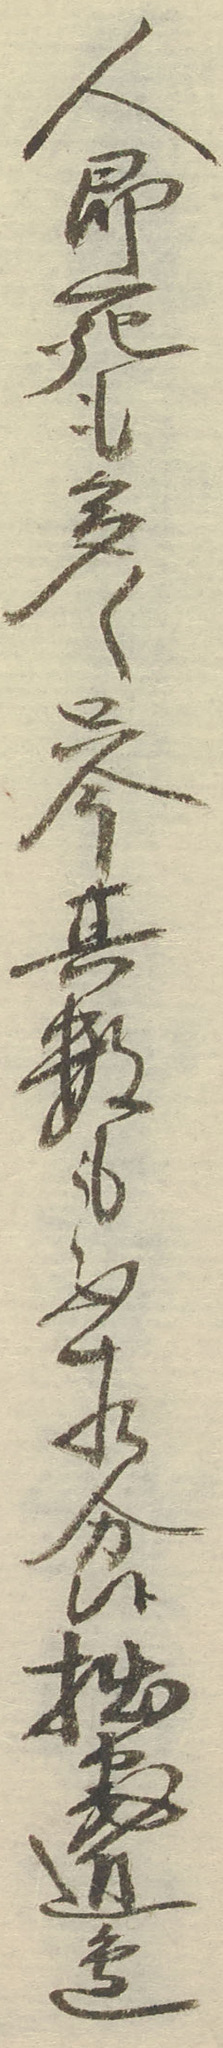人即死も多く只今其数も不相分候拙宅近辺
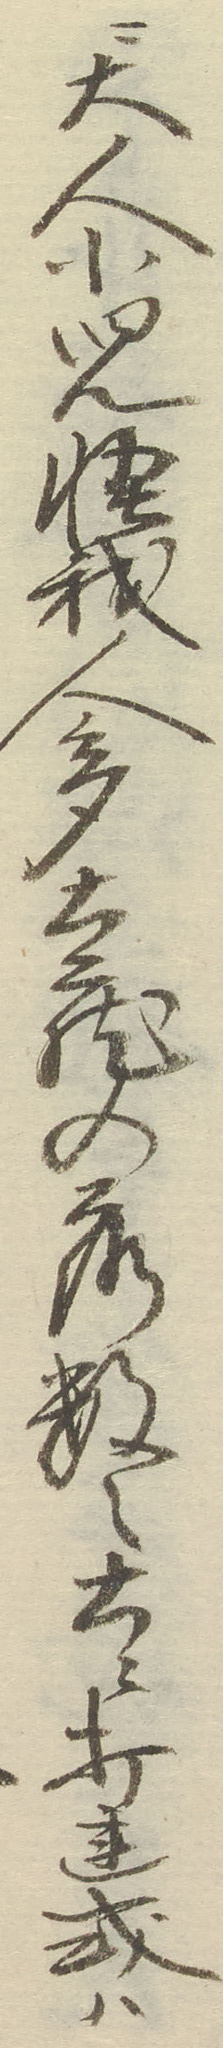ニ大人小児怪我人多土蔵の落数之土ニ打れ或ハ
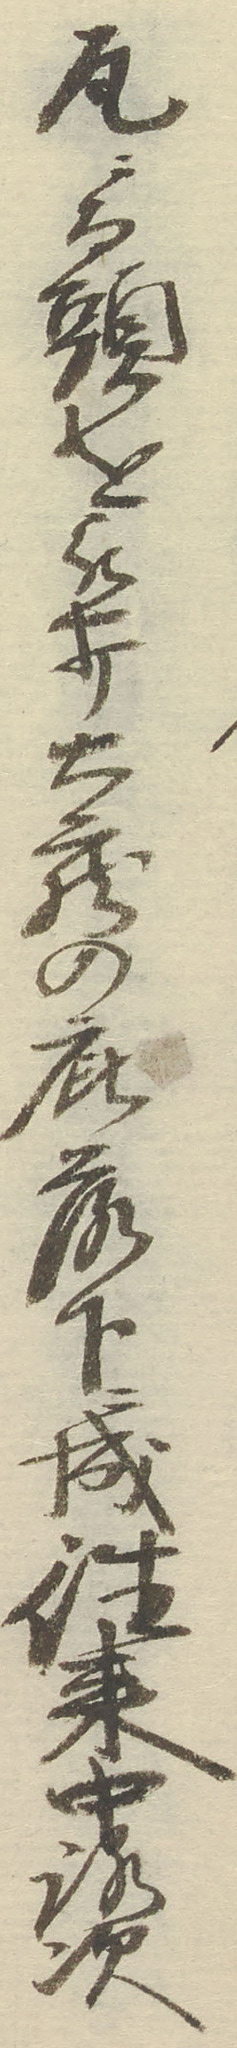瓦ニ而頭を被打土蔵の庇落下ニ成往来中路次
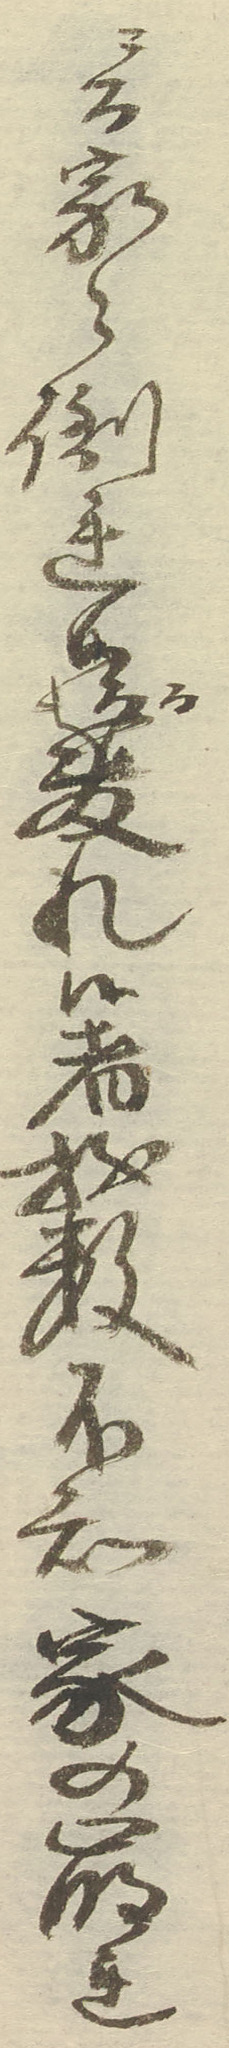ニ而家々倒れ候而敷れ候者抔数不知家の崩れ
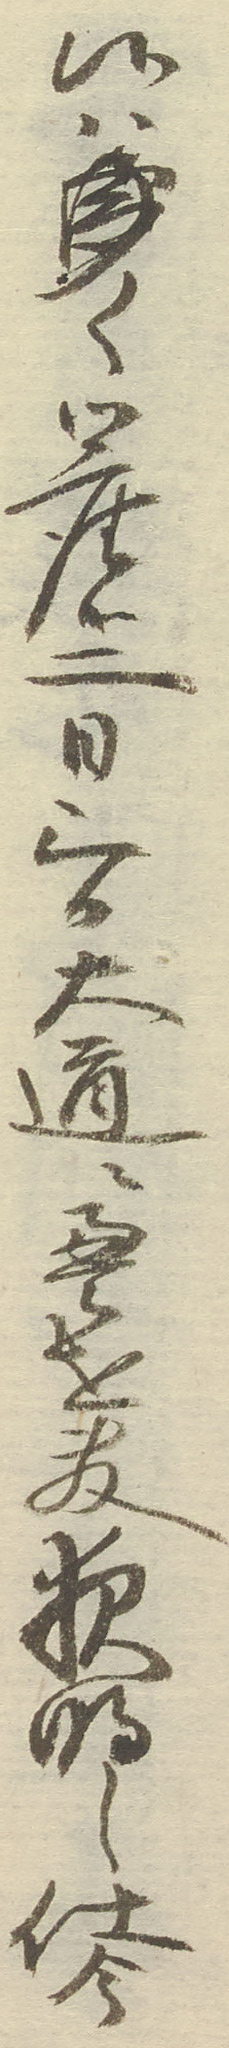候は多く御座候二日三日大道ニ畳を敷夜明し仕今
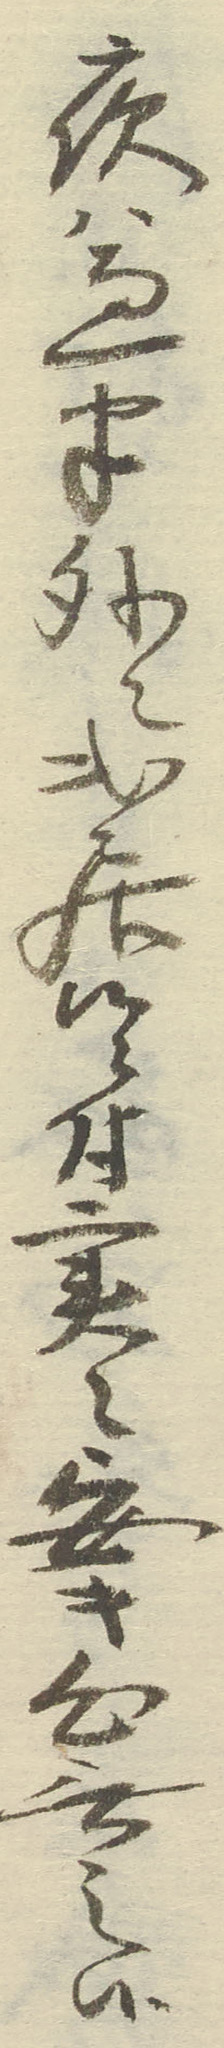夜ハ過半外ニ出居候ニ付実ニ安キ心無之候
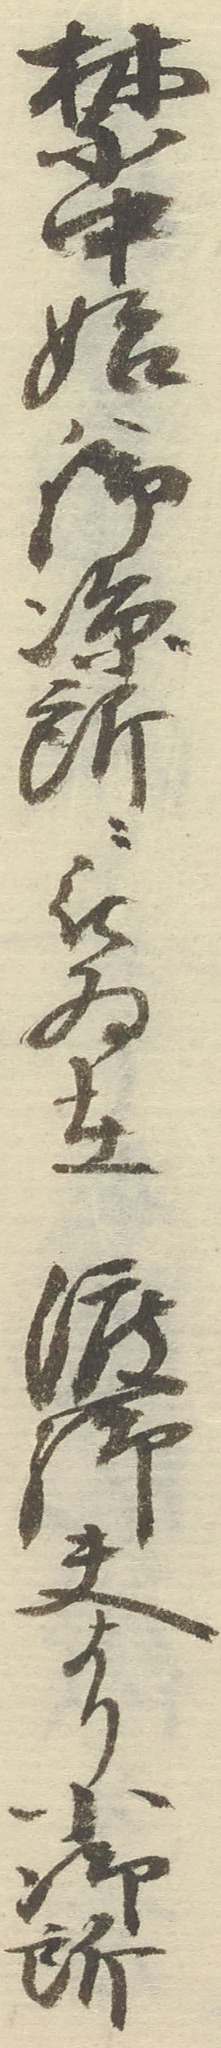禁中始ハ御涼所ニ被為在渡御夫より小御所
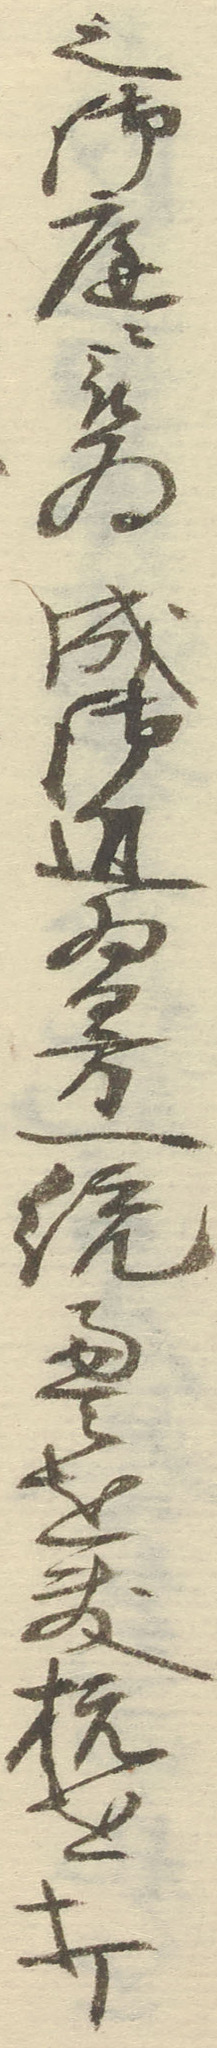之御庭ニ被為成御近習方一統畳を敷杭を打
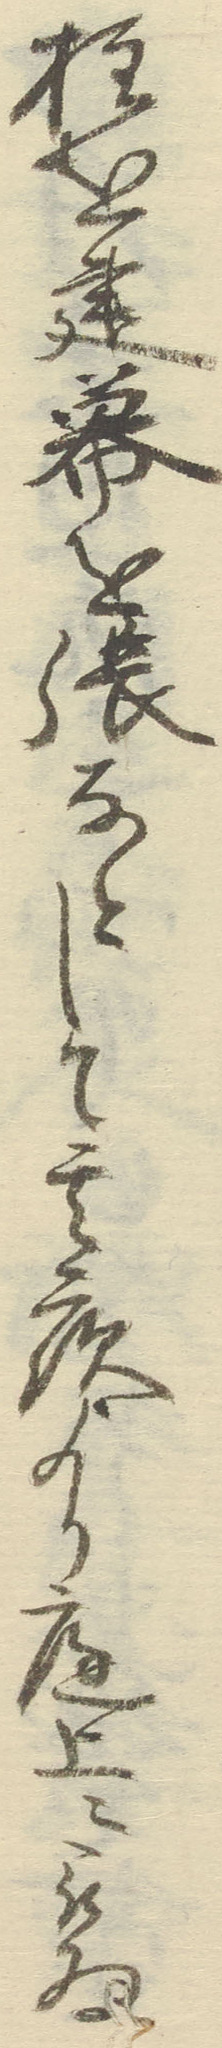柱を建幕を張なとして其夜より庭上に被為
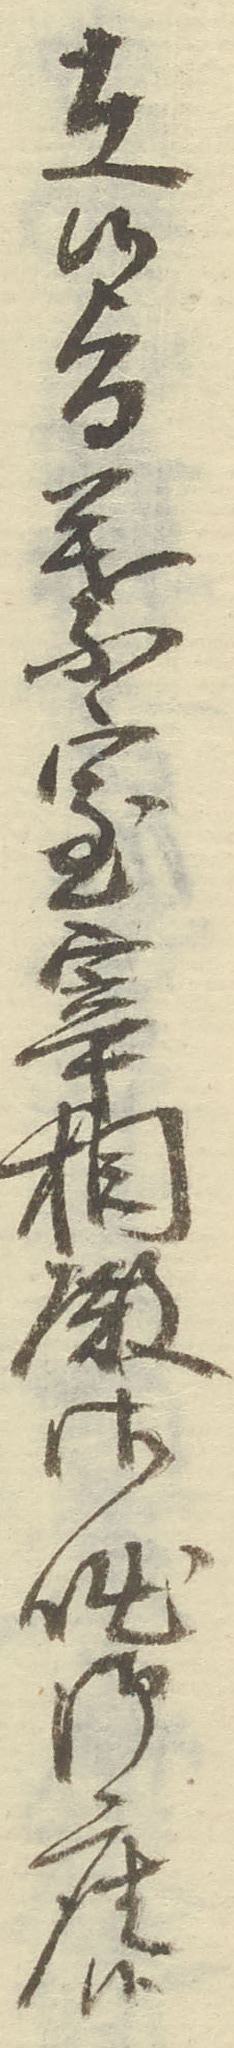在候旨葉室宰相殿御咄御座候
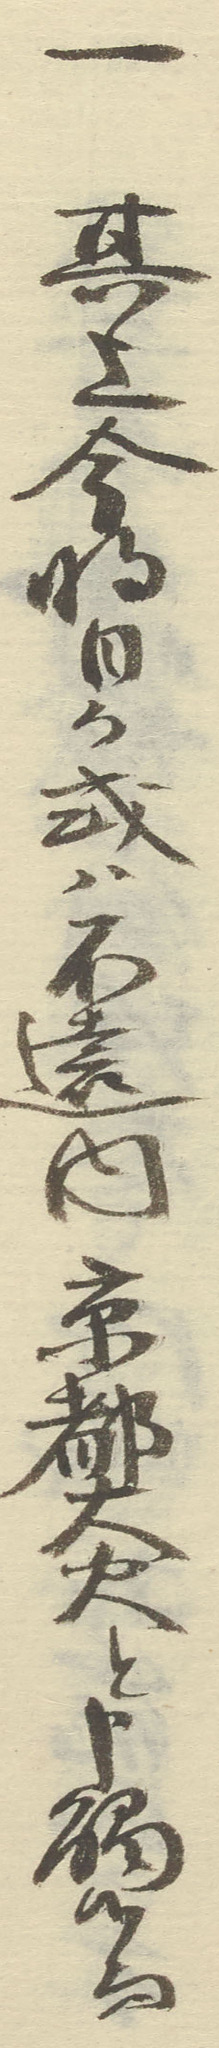一其上今明日か或ハ不遠内京都大火と申觸候而
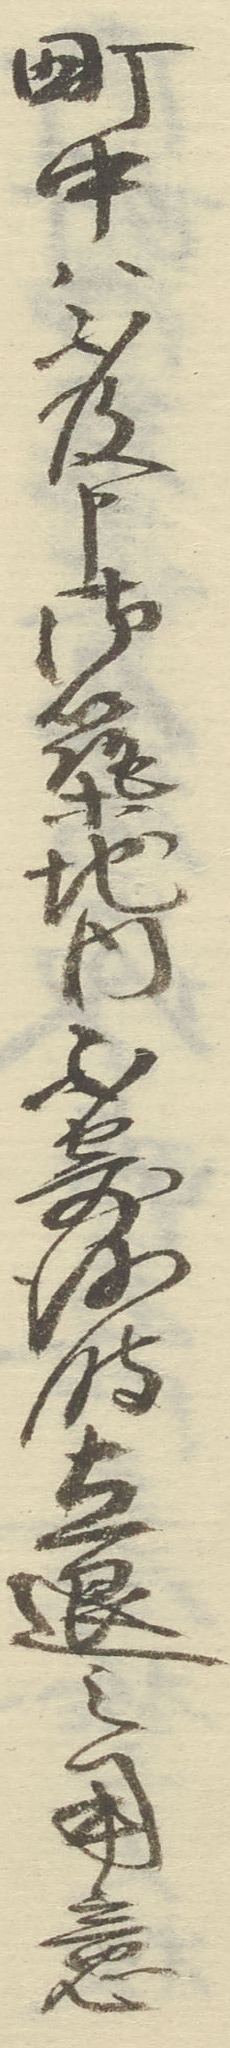町中ハ不及申御築地内不寄何時立退之用意
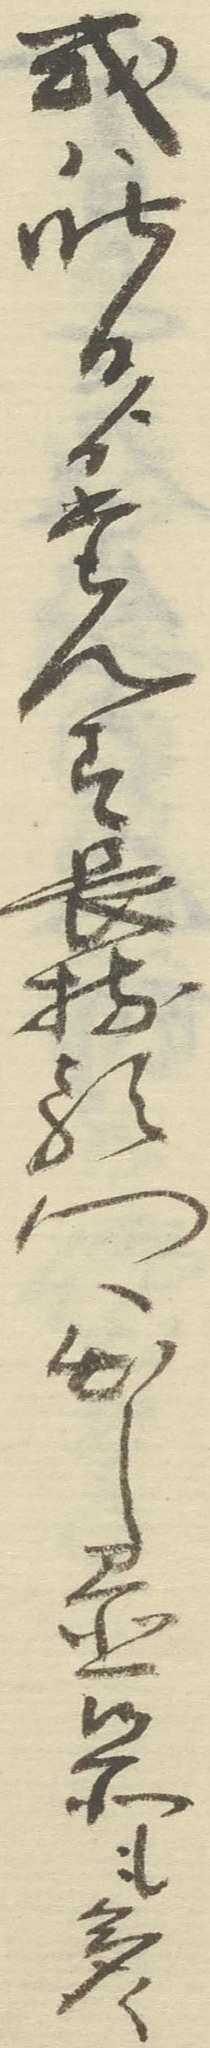或ハ昨日ゟたんす長持類門へ出し置候所も多く
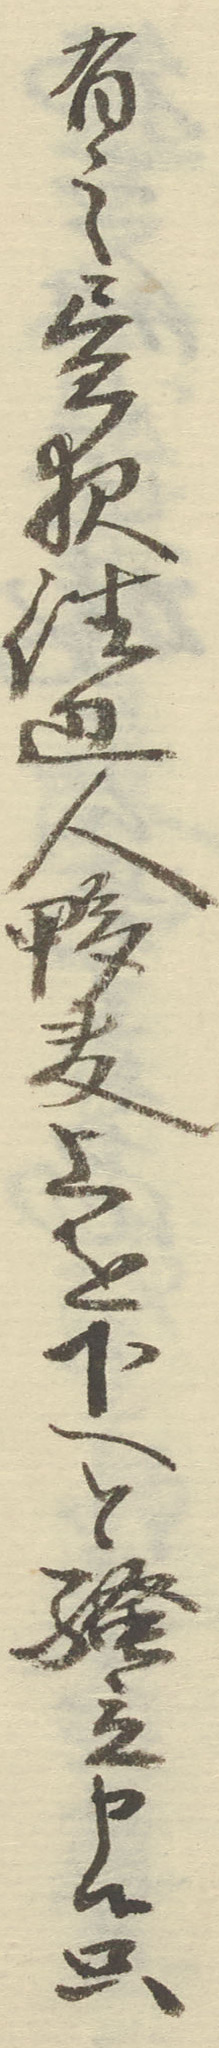有之昼夜往辺人夥敷上を下へと騒立申候只
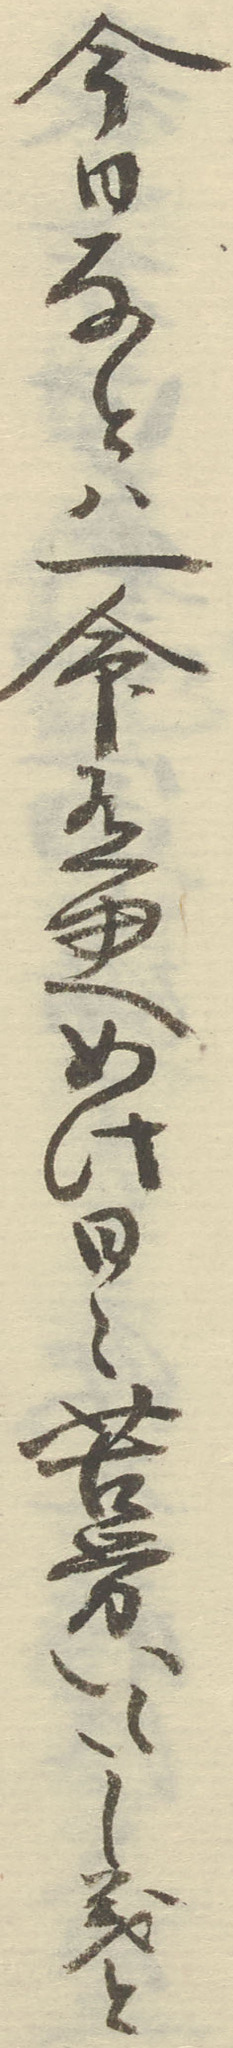今日なとハ一命有ゆへ如此日々苦労いたし義と
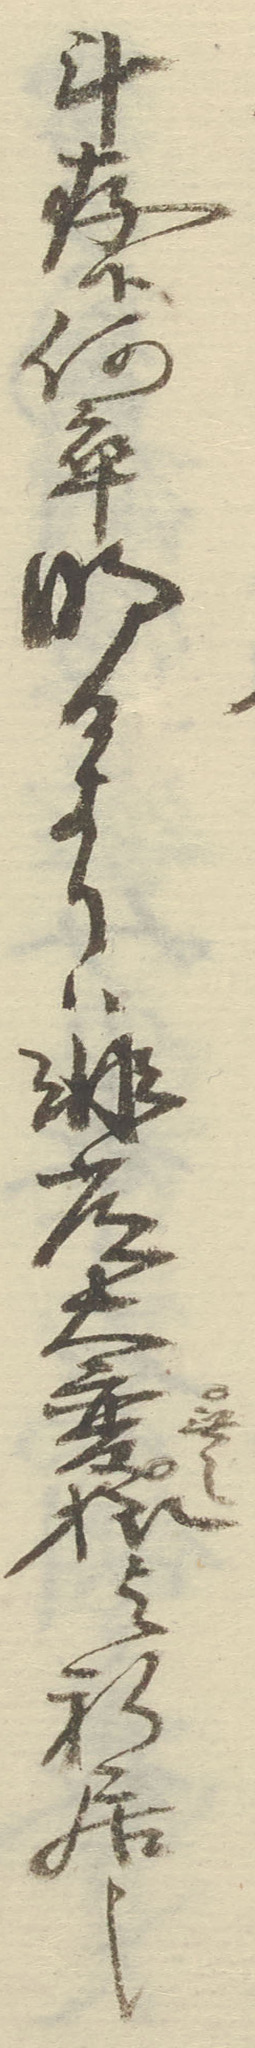斗存候何卒明日よりハ非常大変無之様と祈居申候
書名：[七月二日京都大地震に付御番衆大木市左衛門より申し越し候書面畧書状写]
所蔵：東京大学総合図書館 General Library in the University of Tokyo, JAPAN
